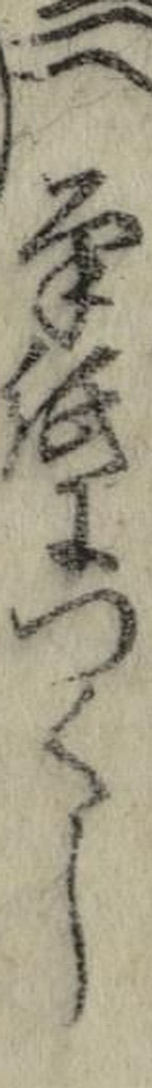筆紙につくし
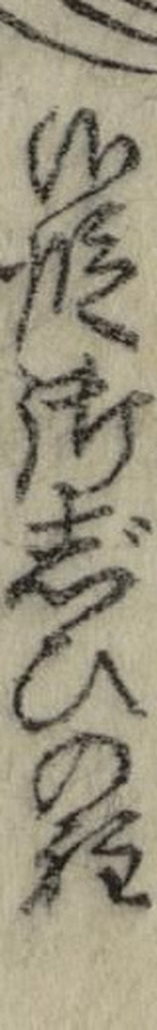候段御じひの程
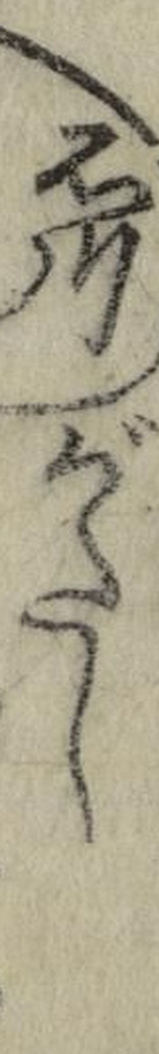がたし
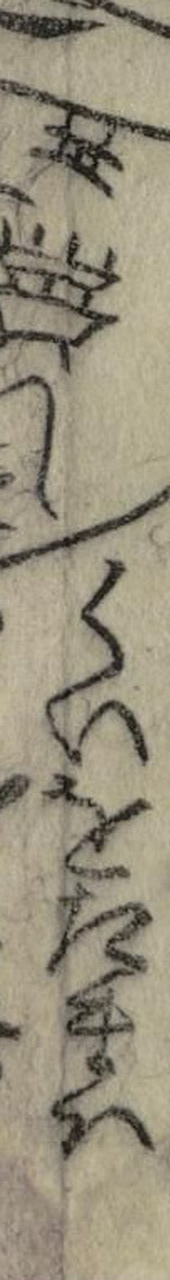くいをたまは
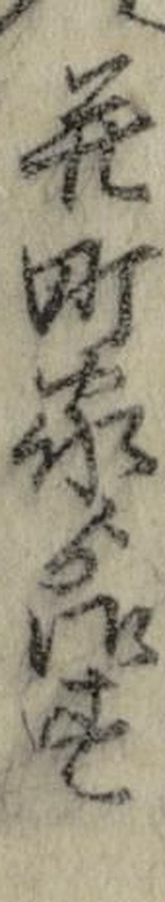并町家ゟ御す
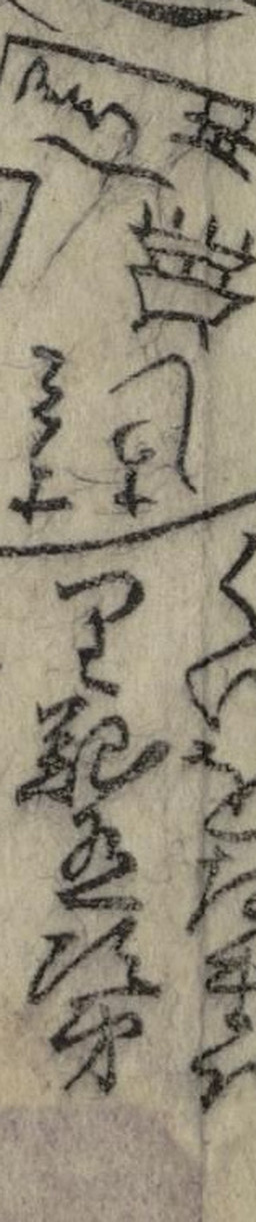り難有次第
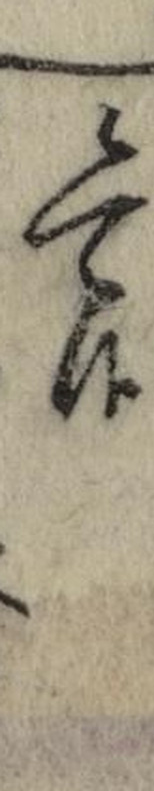にて候
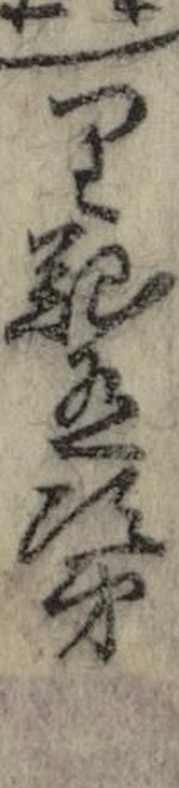り難有次第
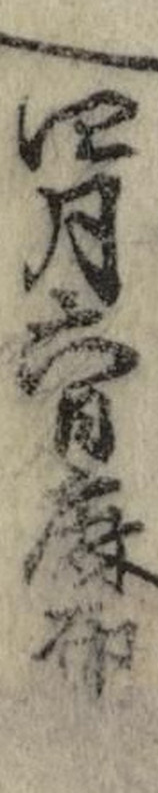四月六日麻布
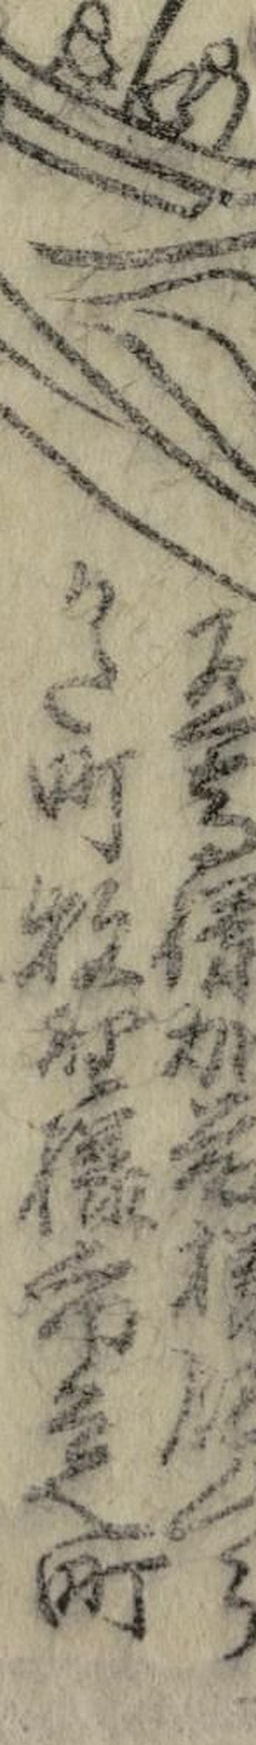かた町牧野様市兵へ町
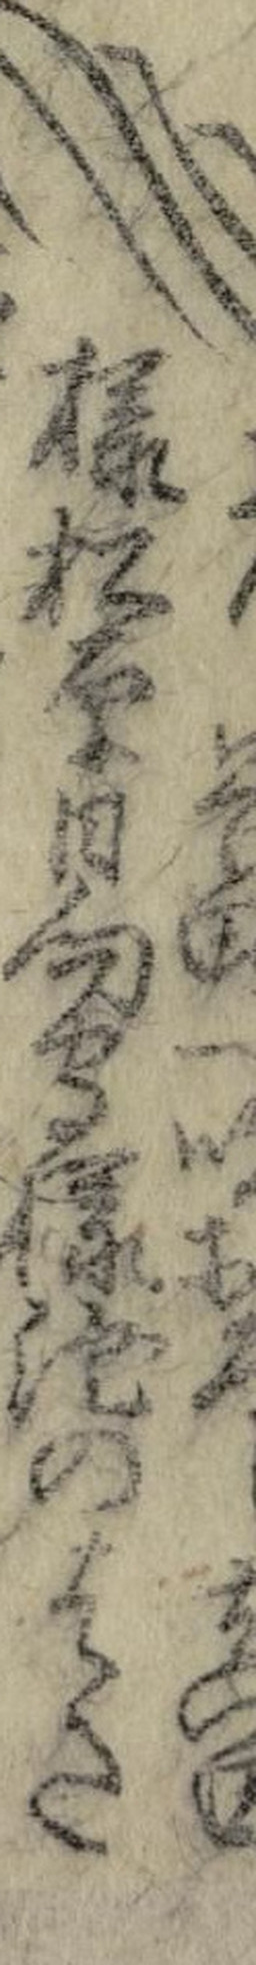様松原日向守様池のはた
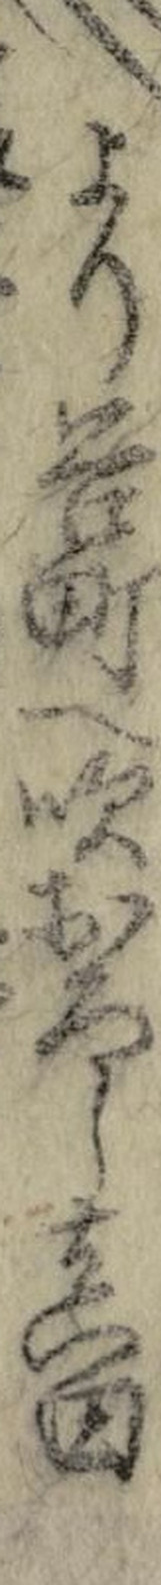より谷町へ吹おろし真田
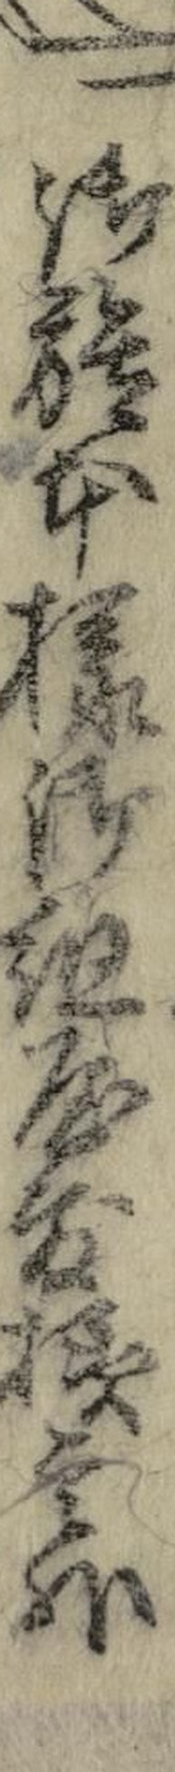御旗本様御組屋敷其外
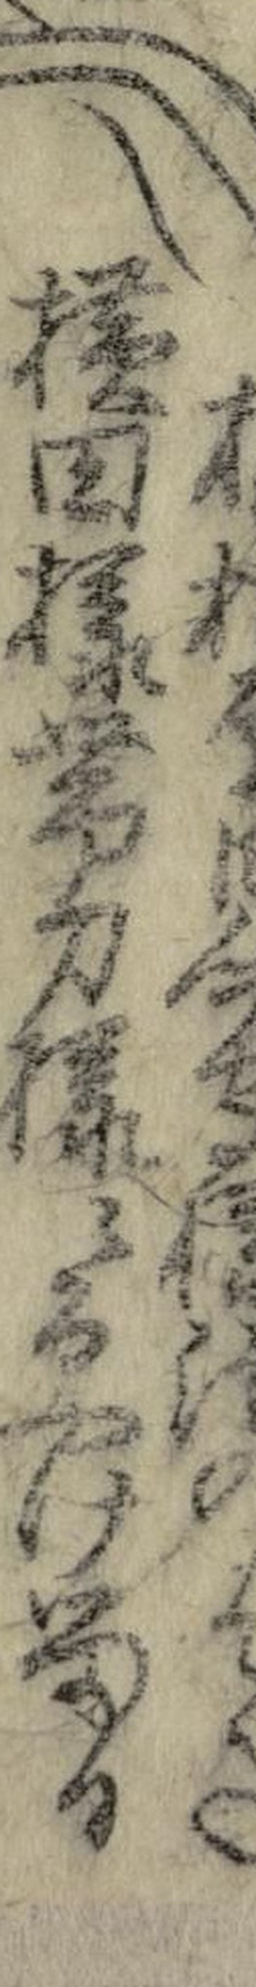権田様帯刀様二而やけ留る
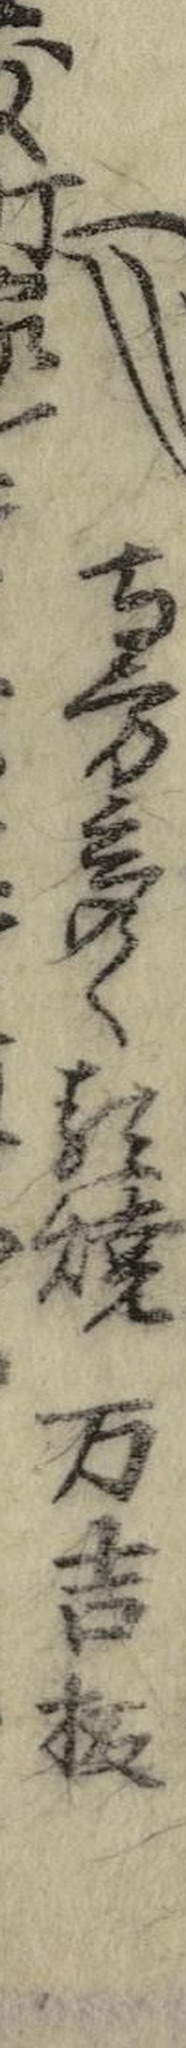寺方多く類焼万吉板
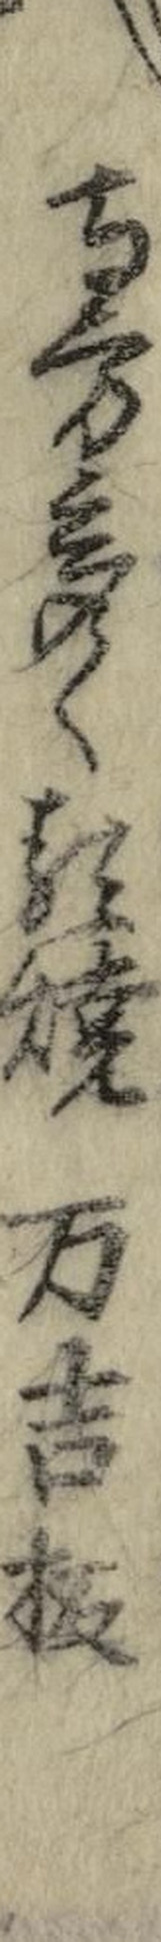寺方多く類焼万吉板
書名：[文政十二年三月の江戸大火に関する瓦版]
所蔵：東京大学地震研究所図書室 Earthquake Research Institute Library, The University of Tokyo, JAPAN
